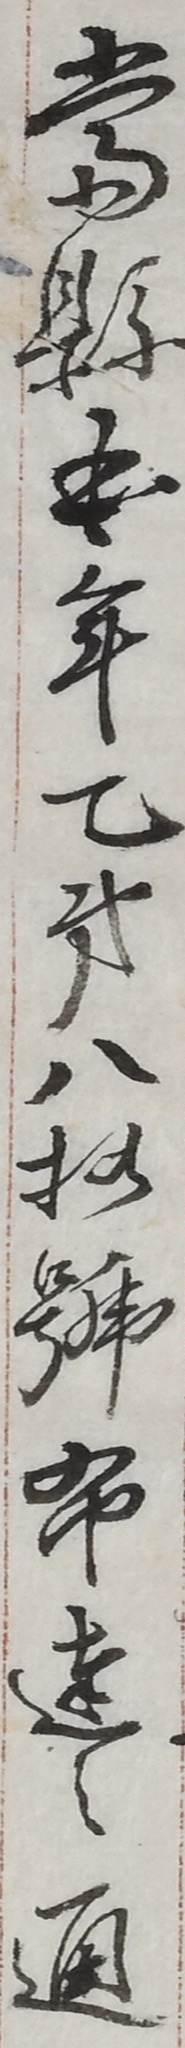当県本年乙第八拾号布達之通
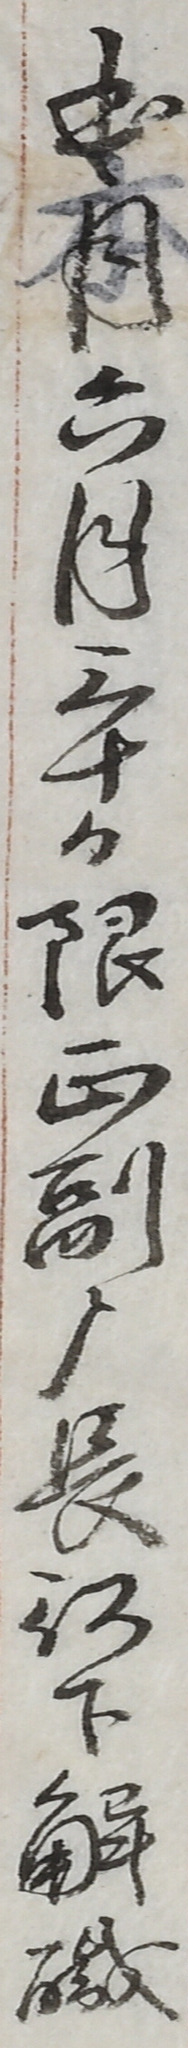本月六月三十日限正副戸長以下解職
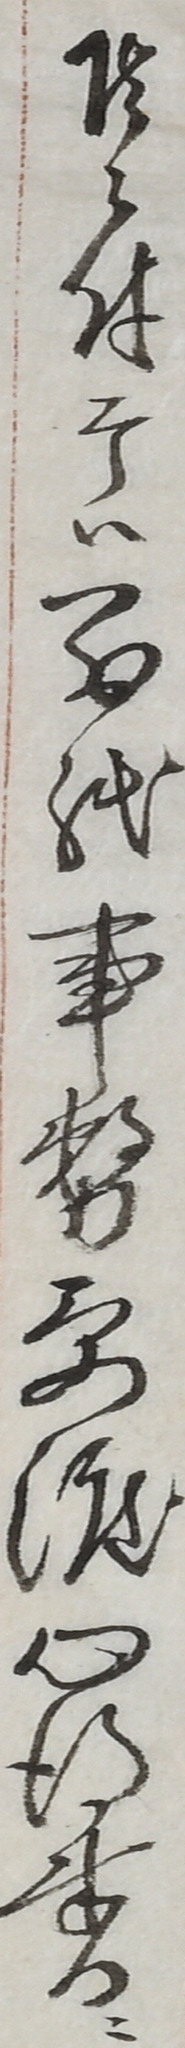候ニ付テハ別紙事務受渡心得書ニ
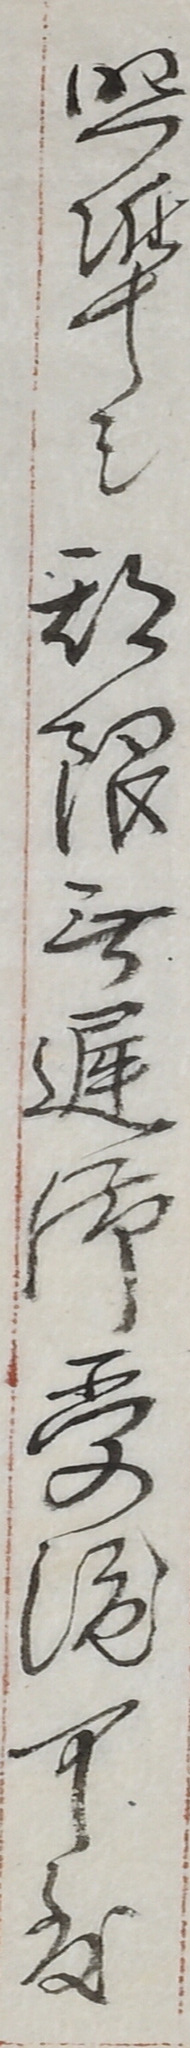照準シ期限無遅滞受渡可致
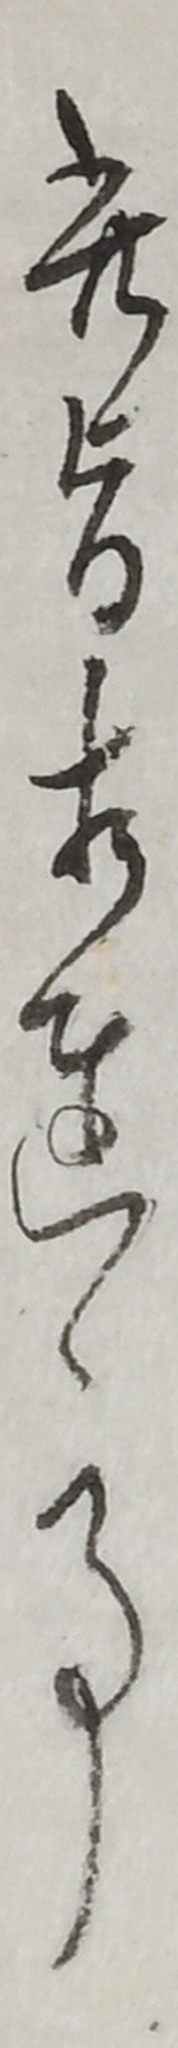此旨相達候事
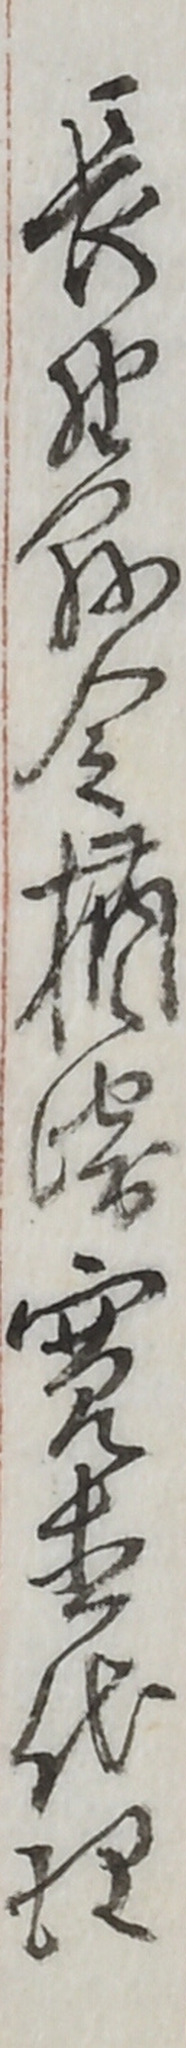長野県令樽崎寛直代理
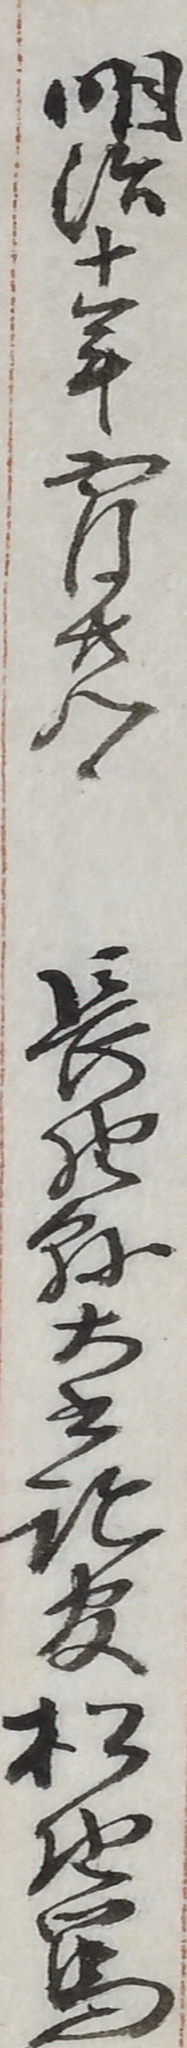明治十年五月廿八日長野県大書記官松野篤
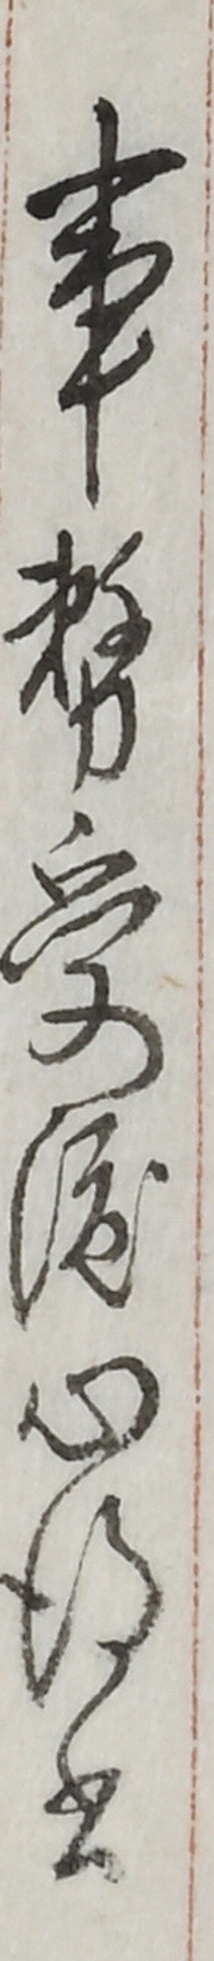事務受渡心得書
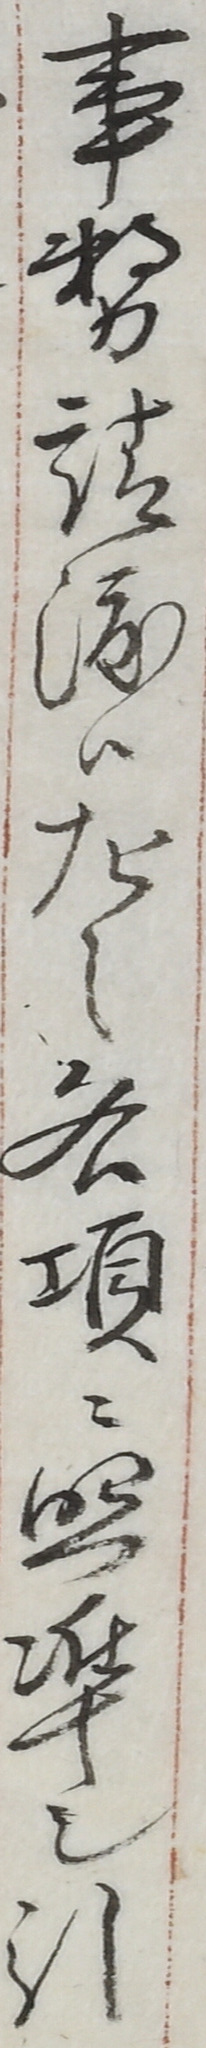事務請渡ハ左之各項ニ照準シ引
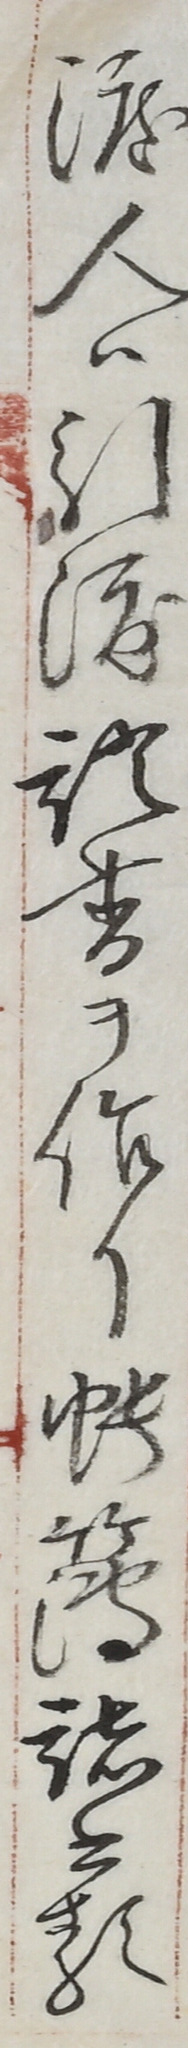渡人ハ引渡証書ヲ作り帳簿諸書類

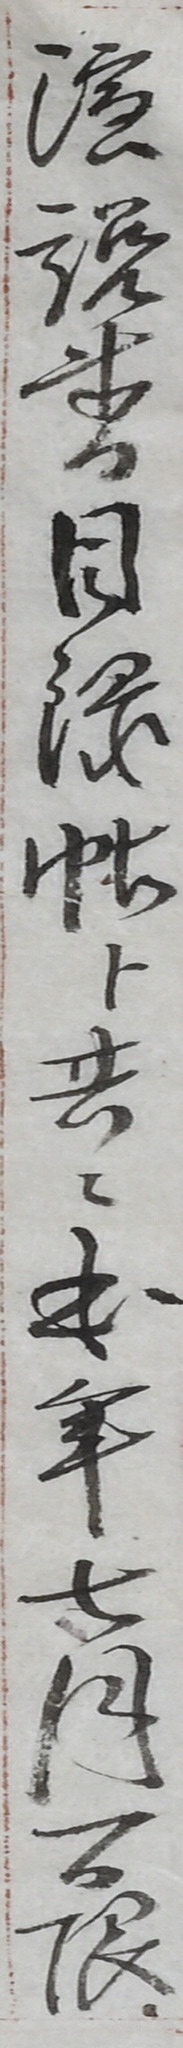演説書目録帳ト共ニ本年七月一日限
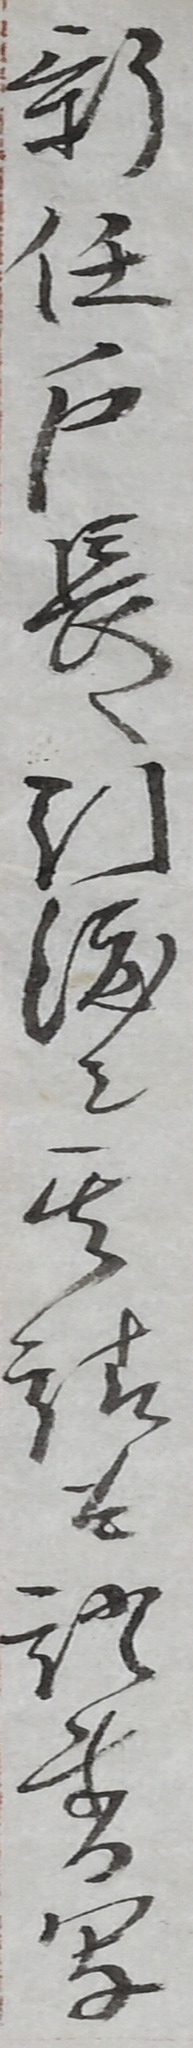新任戸長へ引渡シ其請取証書写
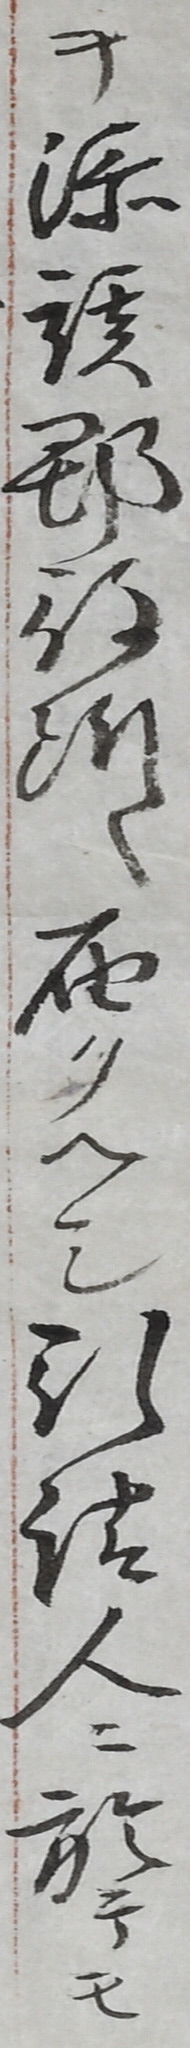ヲ添該郡役所へ届クヘシ引請人ニ於テモ
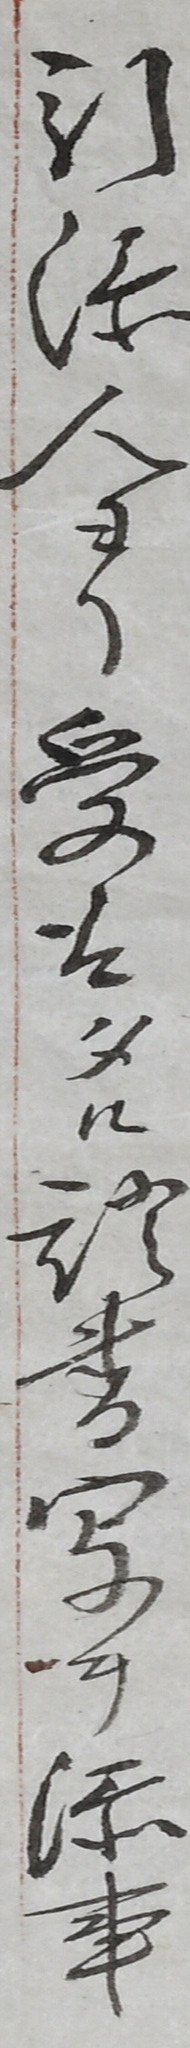引添人より受取タル証書写ヲ添事
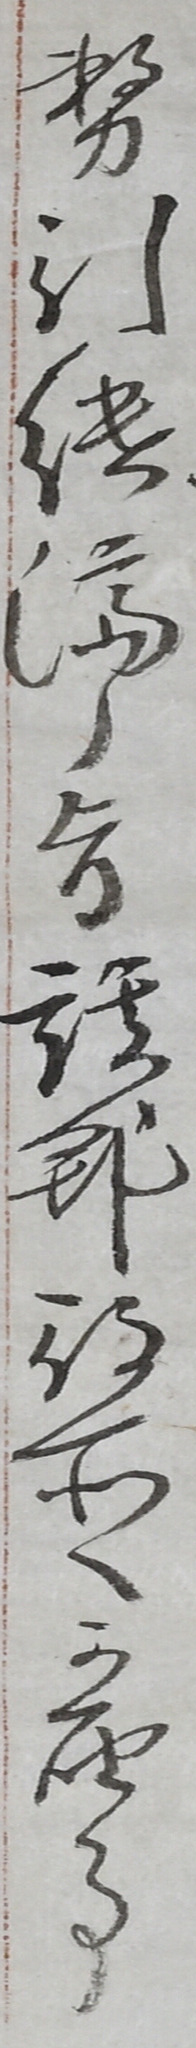務引継済之旨該郡役所へ可届事
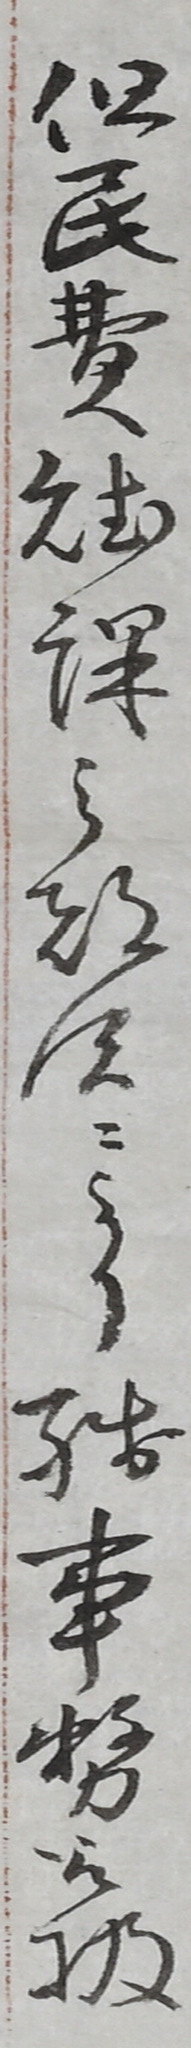但民費賦課之都合法ニより残事務取扱
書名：郡役所勤務中御用抜書
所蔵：伊那市立高遠町図書館・合同会社AMANE
